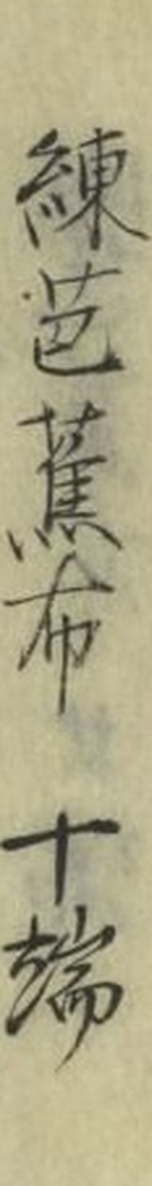練芭蕉布十端
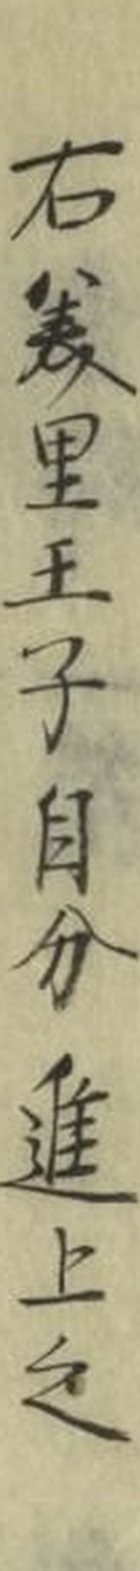右美里王子自分進上之
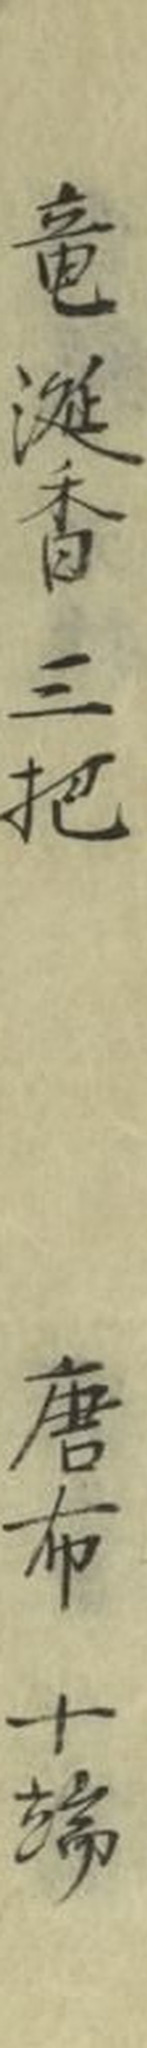竜涎香三把唐布十端
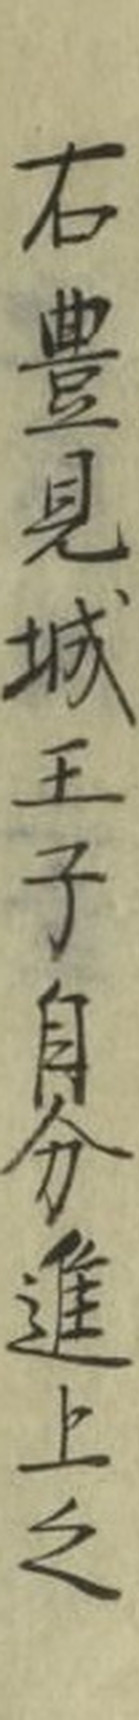右豊見城王子自分献上之
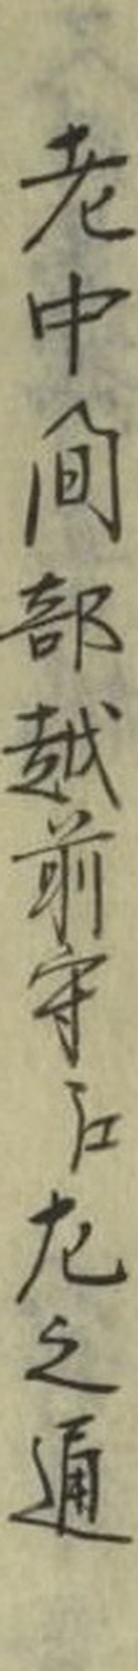老中間部越前守え左之通
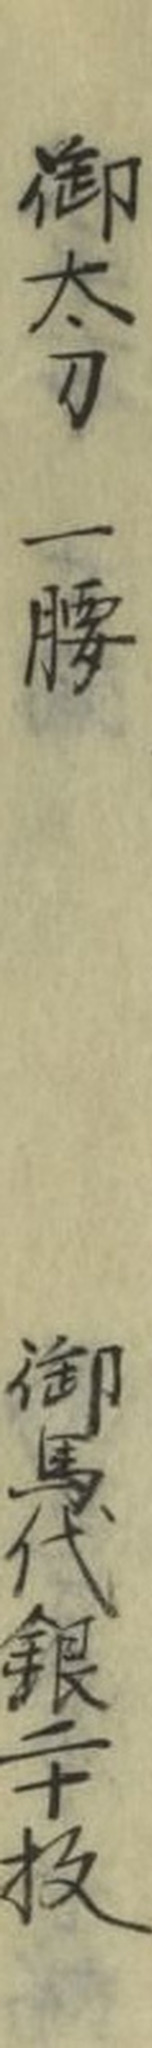御太刀一腰御馬代銀二十枚

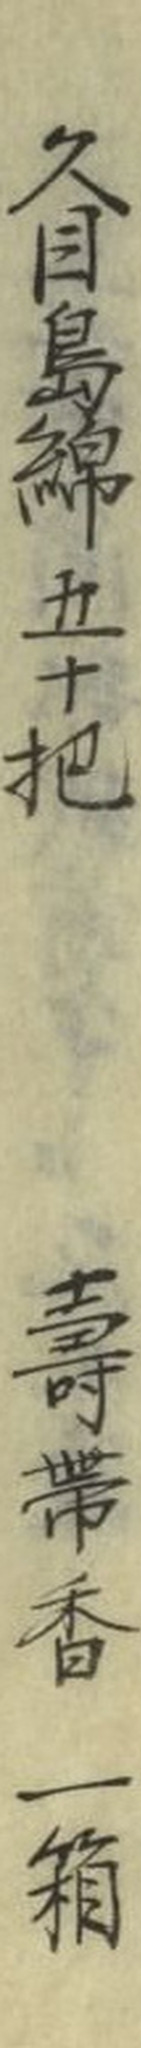久目島綿五十把寿帯香一箱
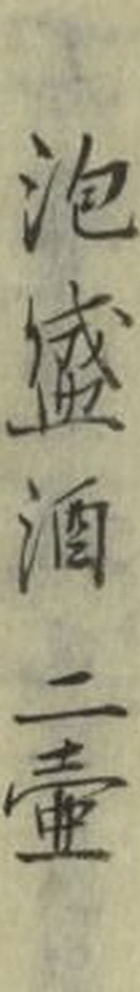泡盛酒二壺
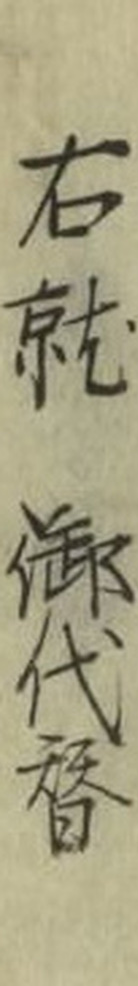右就御代替
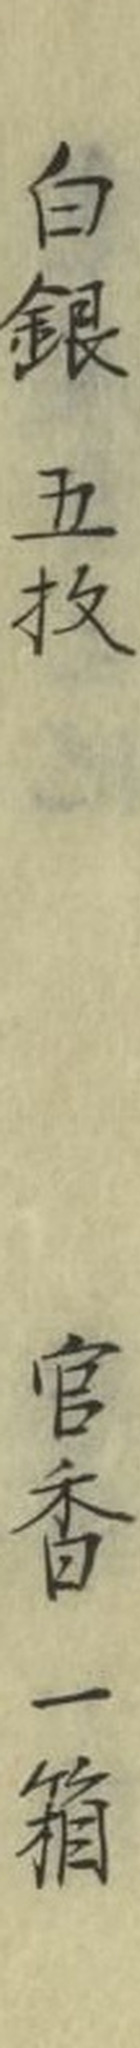白銀五枚官香一箱
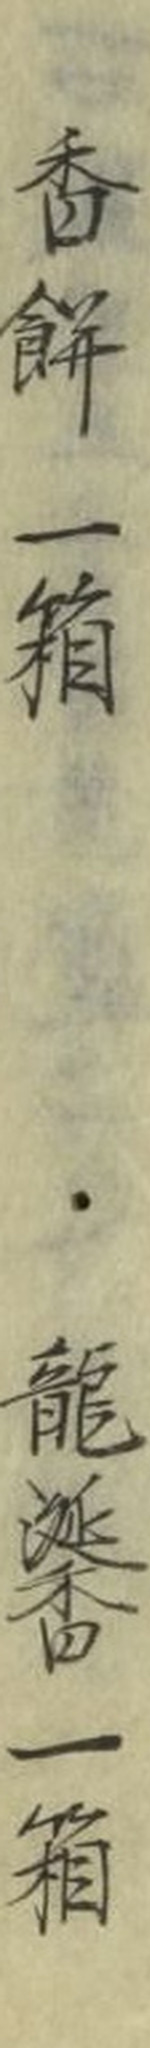香餅一箱龍涎香一箱
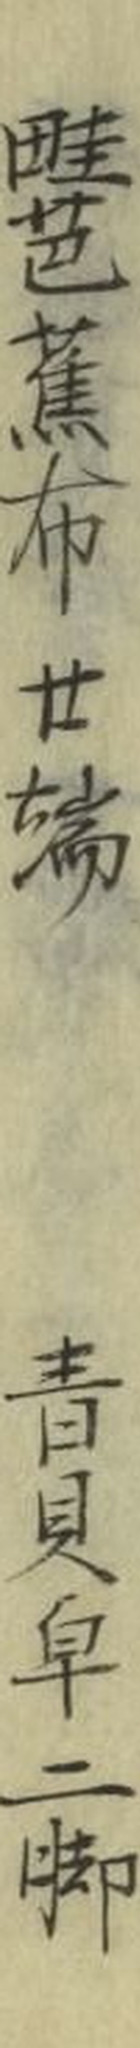畔芭蕉布廿端青貝卓二脚
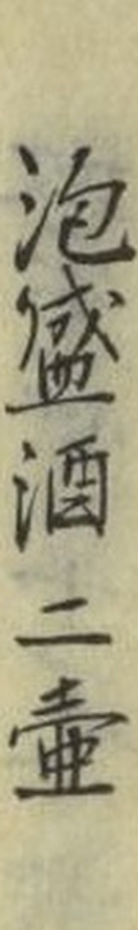泡盛酒二壺
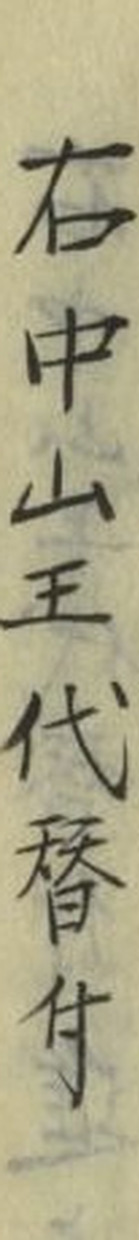右中山王代替付
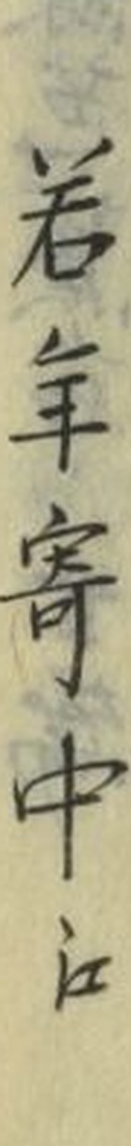若年寄中え
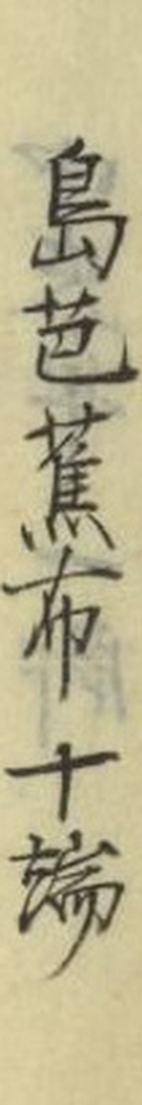練芭蕉布十端
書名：宝永七庚寅年琉球国来聘使日記
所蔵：University of the Ryukyus Library
